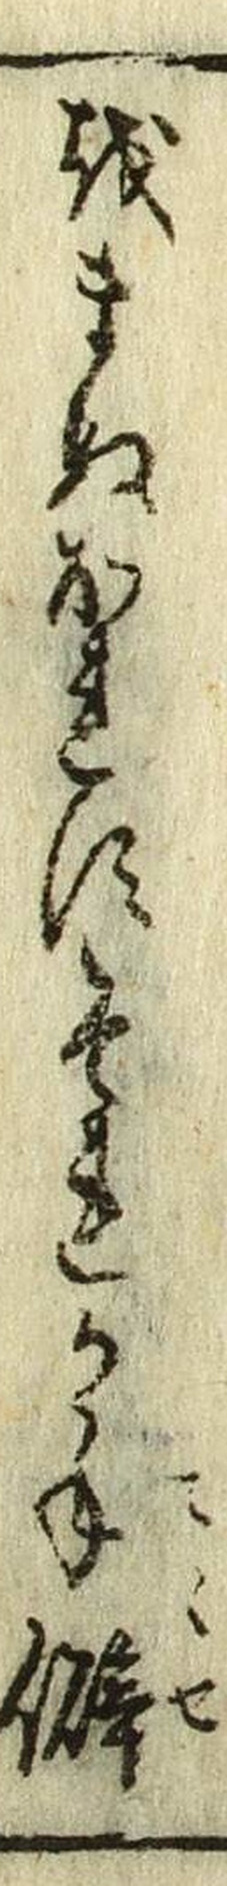をまぬかれすそれか手僻
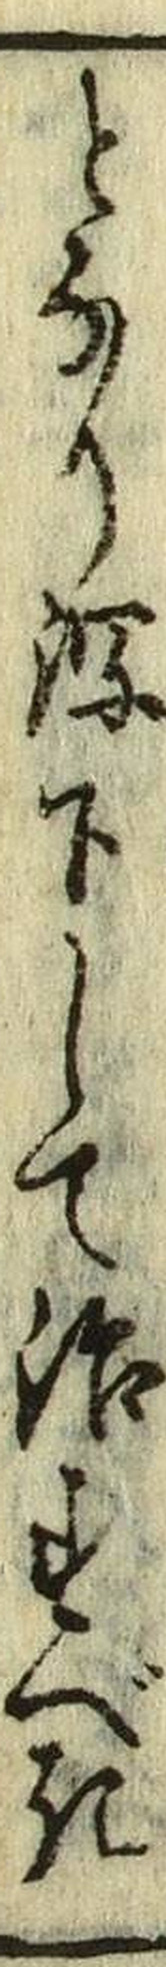となり瀉下して治すべき

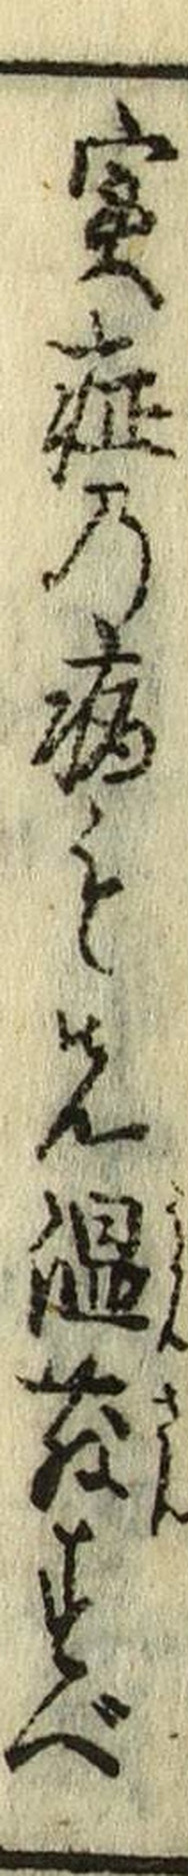実症の病も先温散すべ
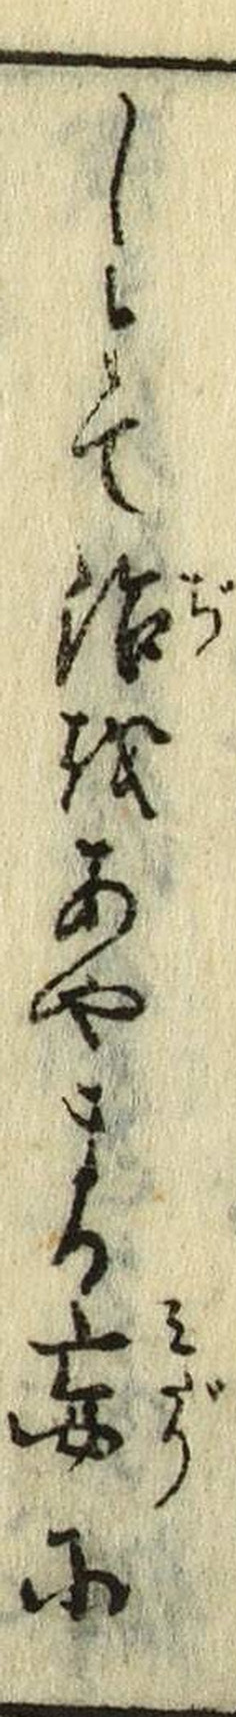しとて治をあやまる妄に
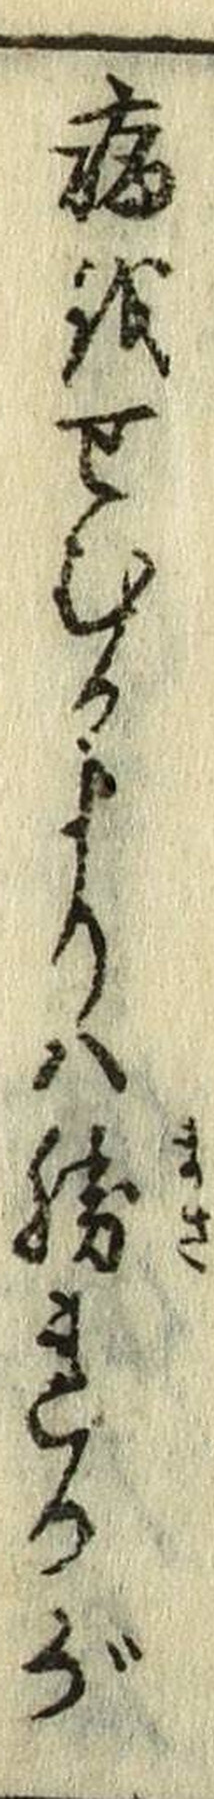病をせむるよりは勝れるが
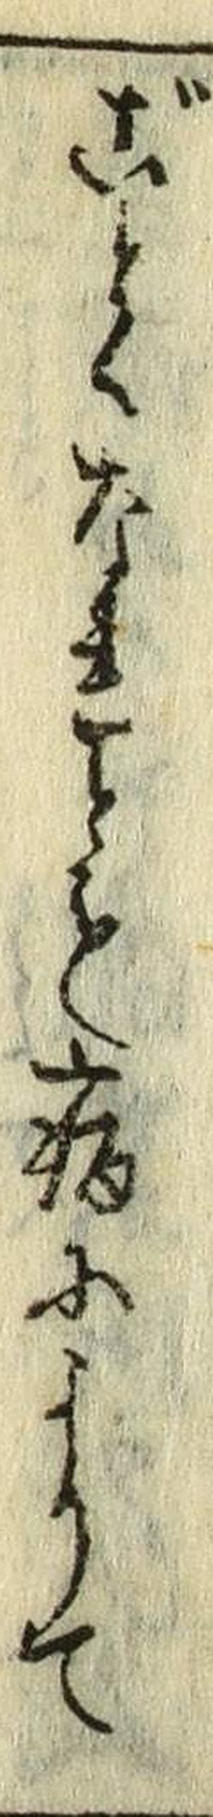ごとくなれとも病によりて
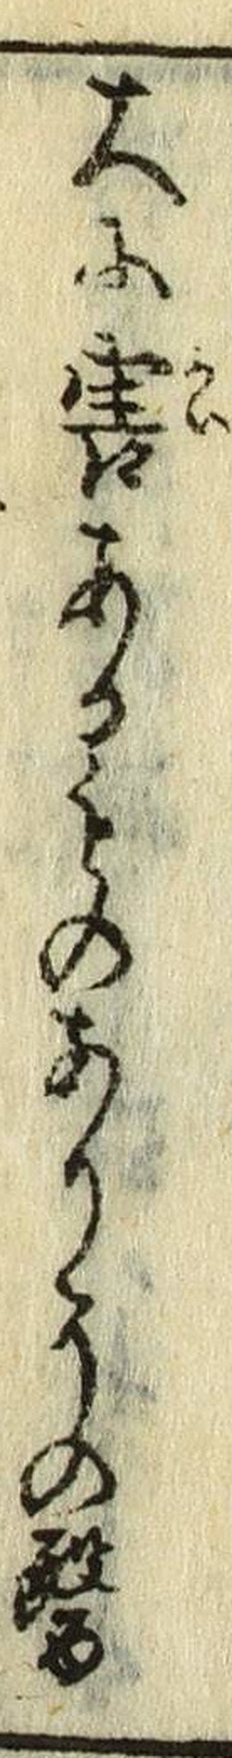大に害あるものありその医
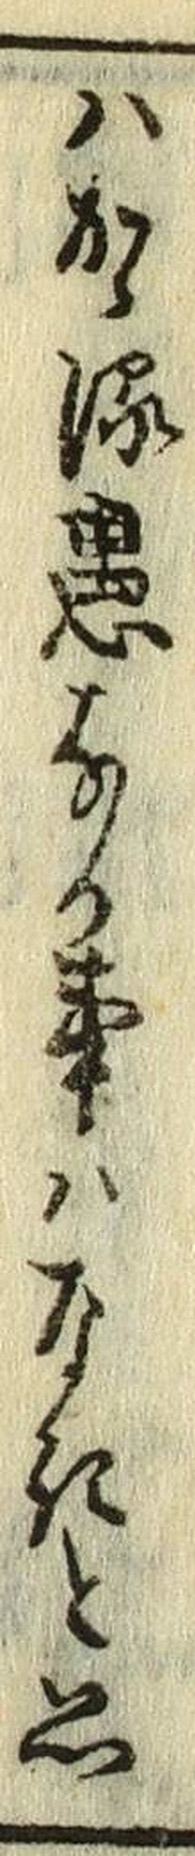はかゝる愚なる事はなきと思
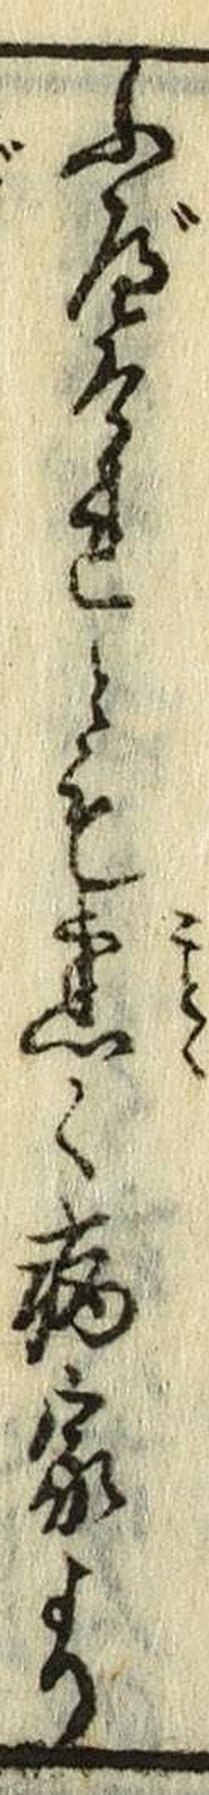ふべけれとも悉く病家より
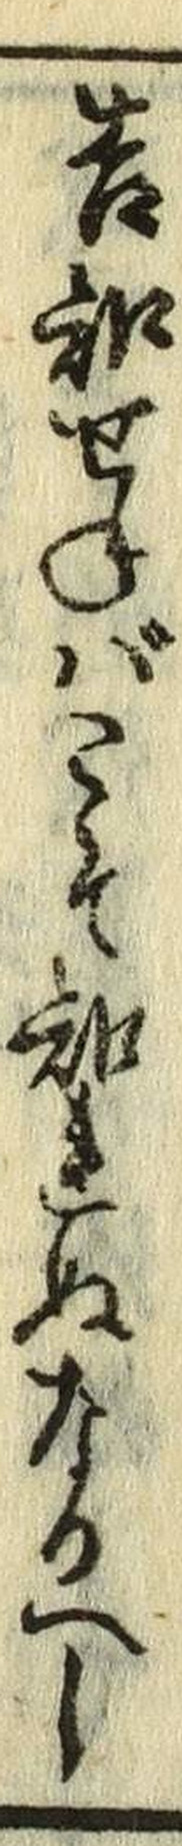告知せねばこそ知れぬなるへし
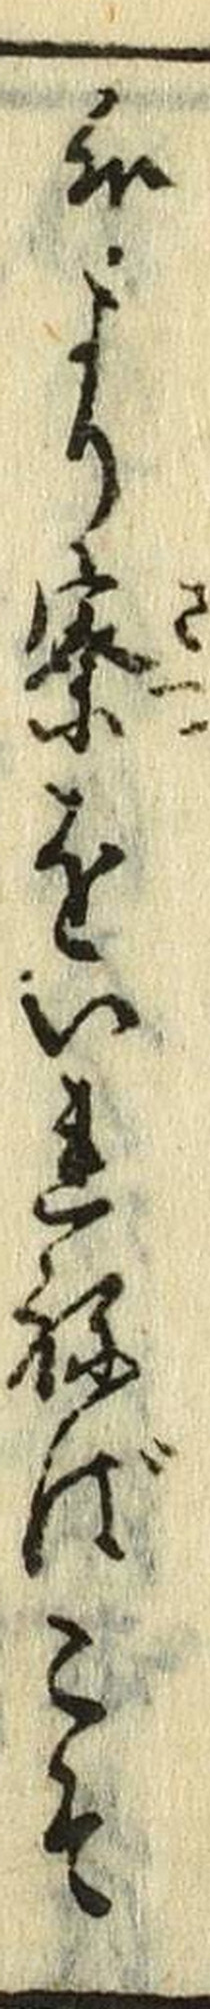外より察をいれねばこそ
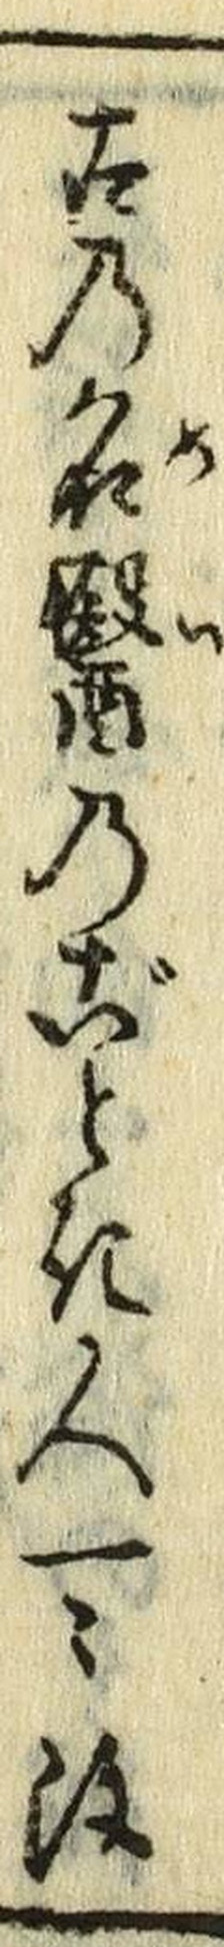この名医のごとき人一々改
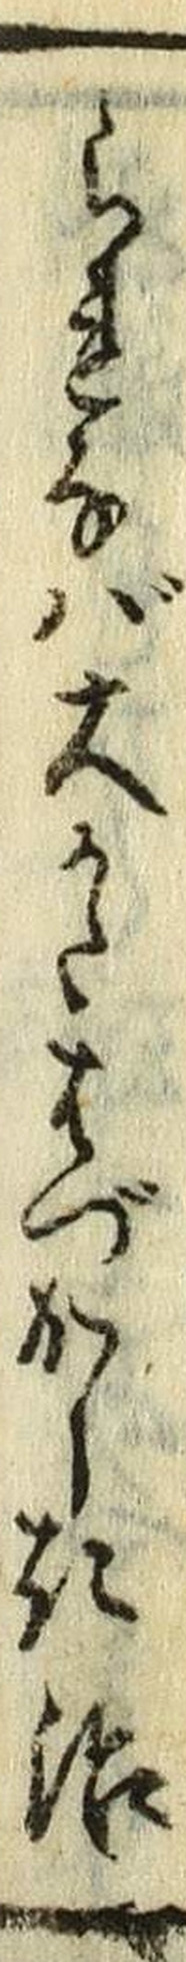られなば大かたはづかしき治
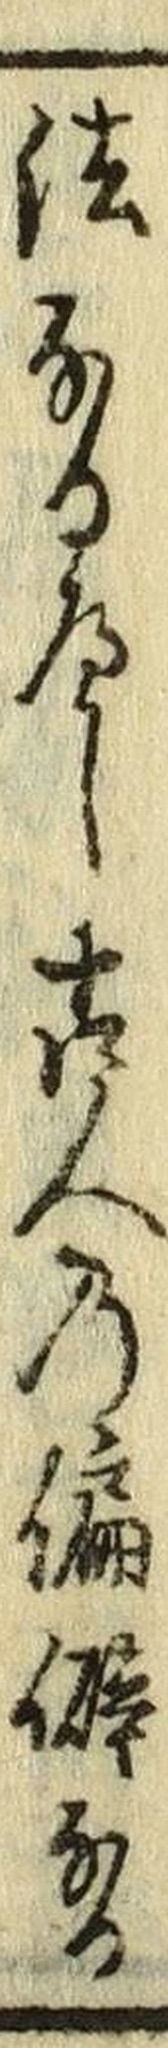法なるへし古人の偏僻なる
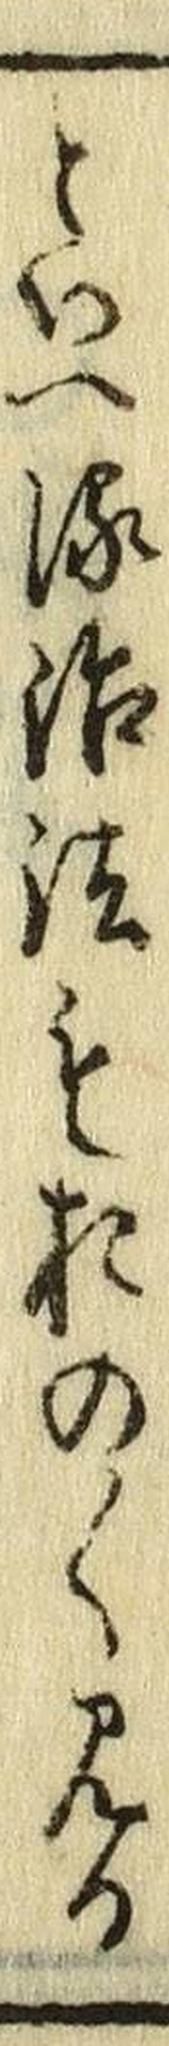といへる治法もおの〳〵見る
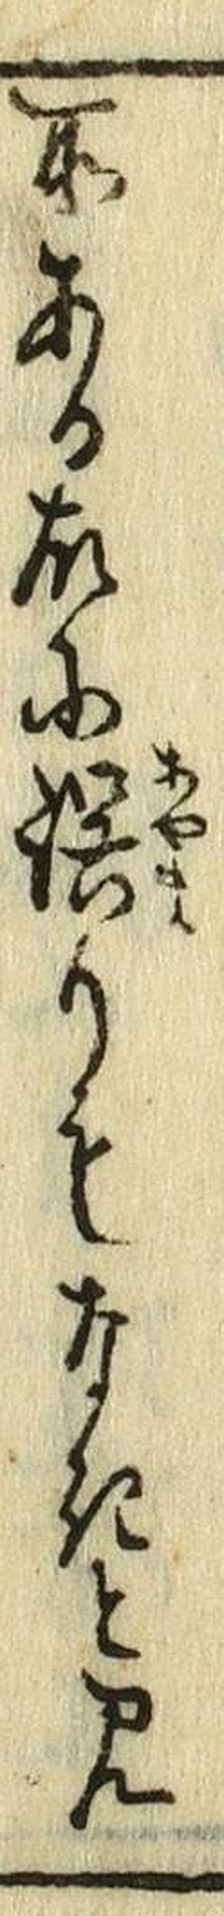所ある故に誤りもなきと見
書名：居家養生記
